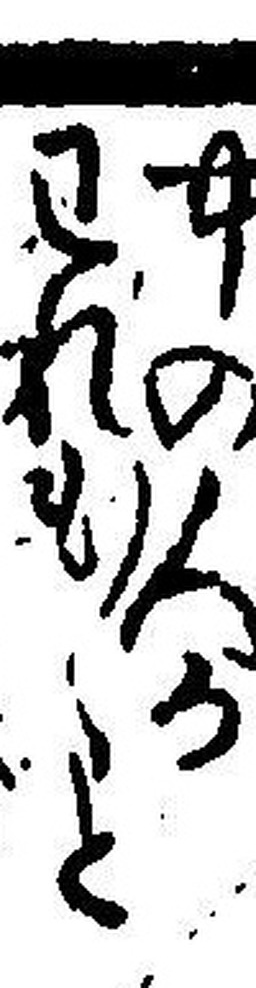われも〳〵と
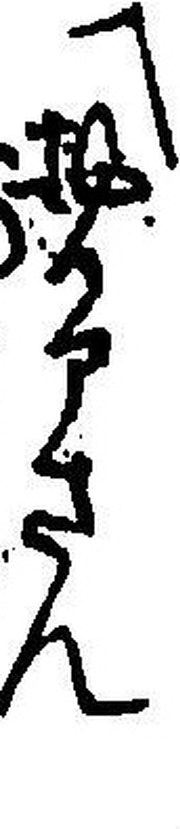〽おかァさん
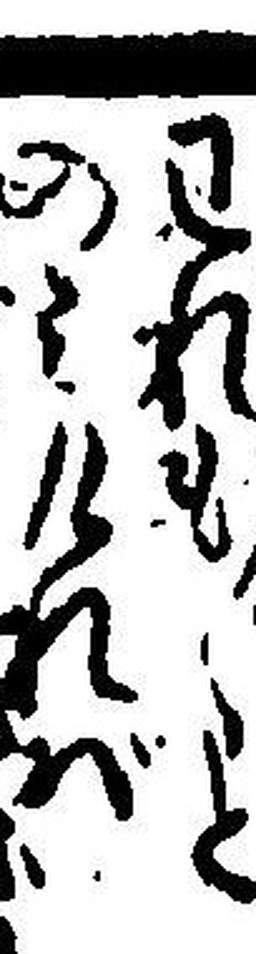のみければ
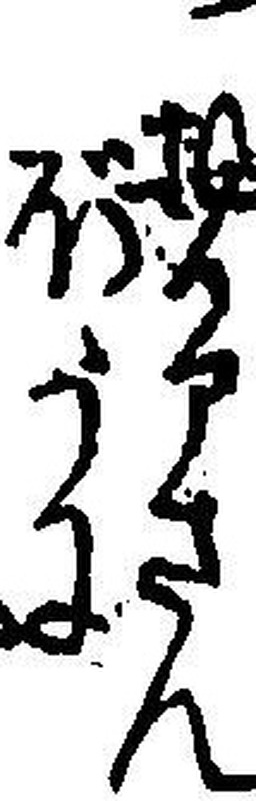ぼうに
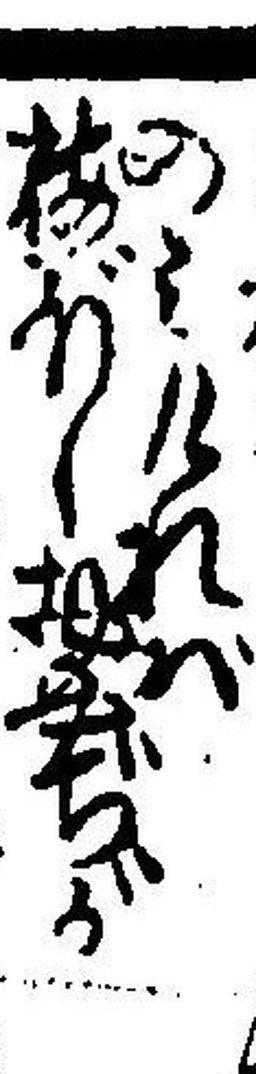梅ぼしおやぢが
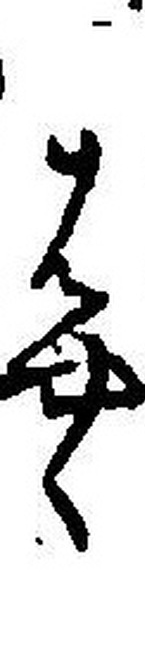はやく
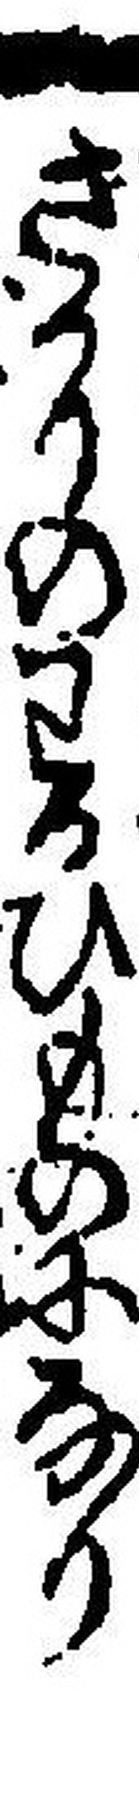さかりのわかひものになり
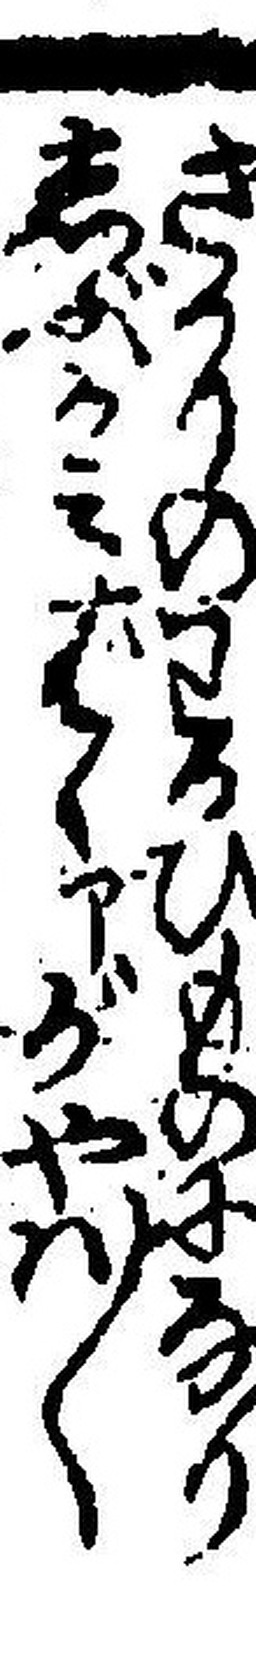しぶかみばゞァがやは〳〵
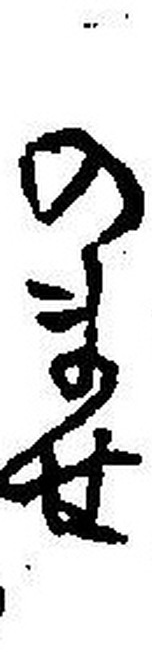のませ
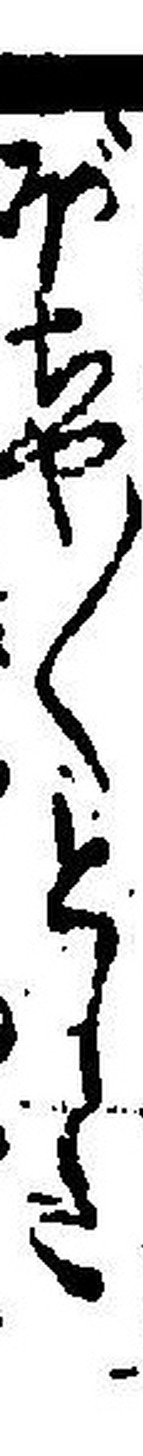ぼちや〳〵とした
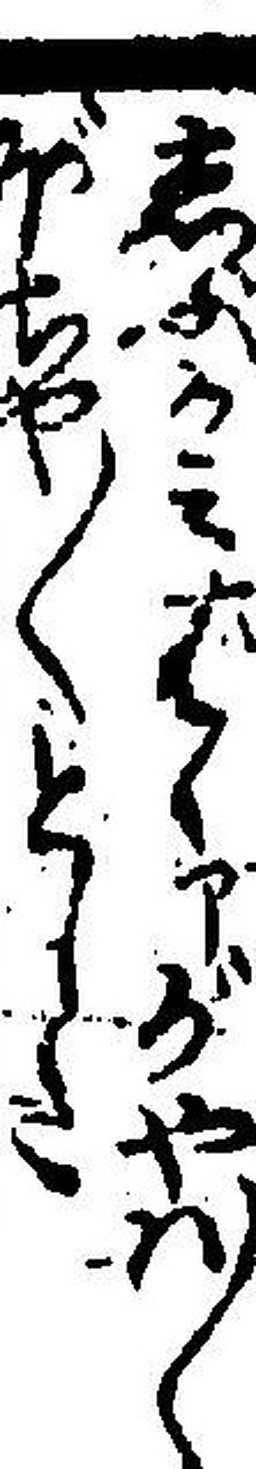ぼちや〳〵とした
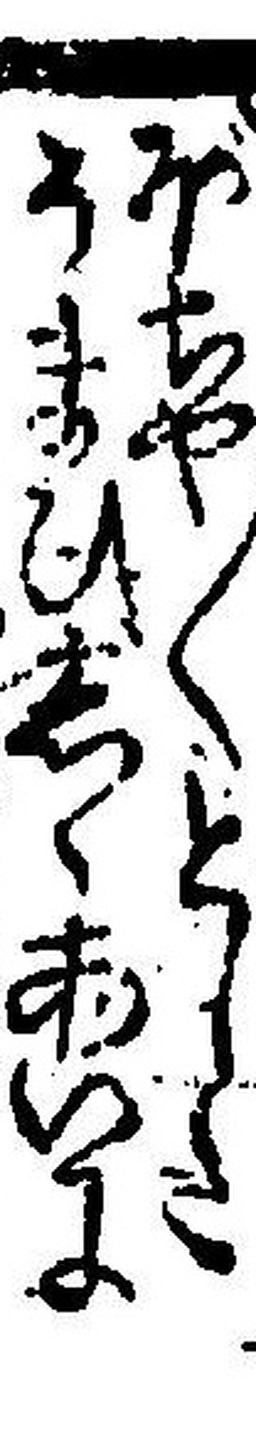うまひしゝあいに
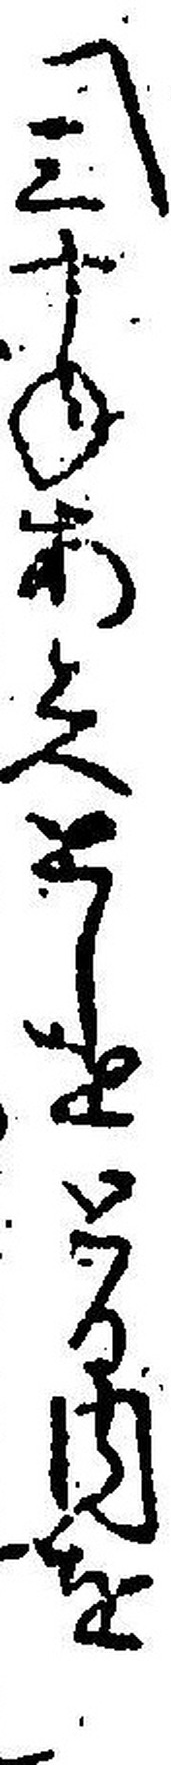〽三十年あとへとしをとる内を
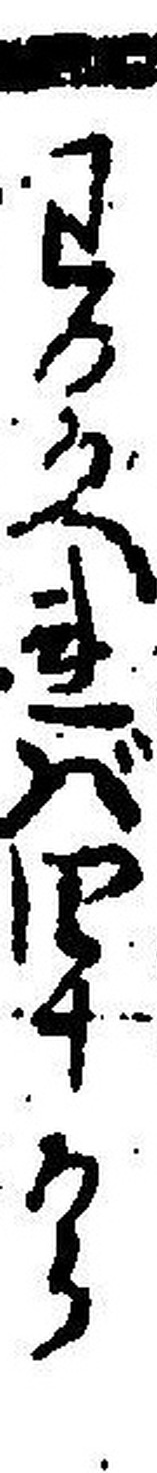わかかへれば四十から
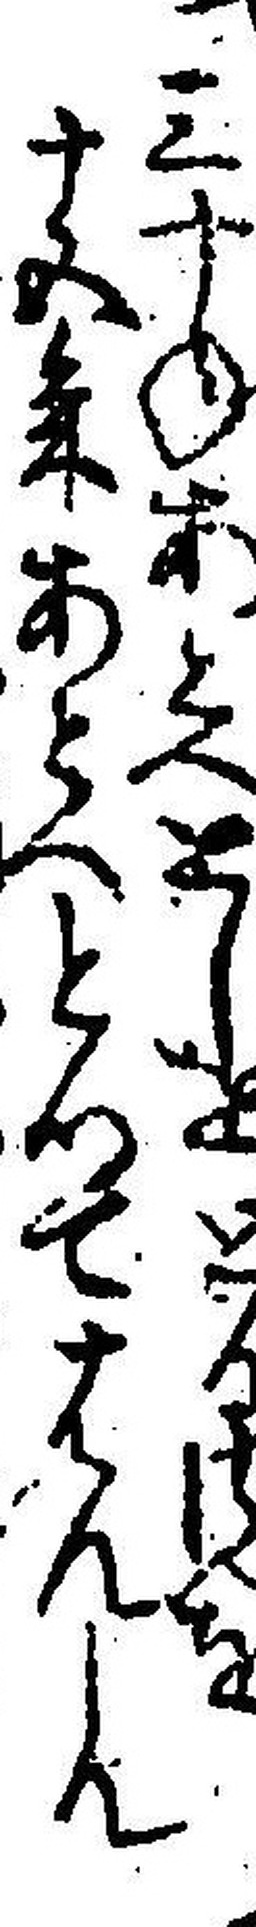十五年あとへとつてはんしん
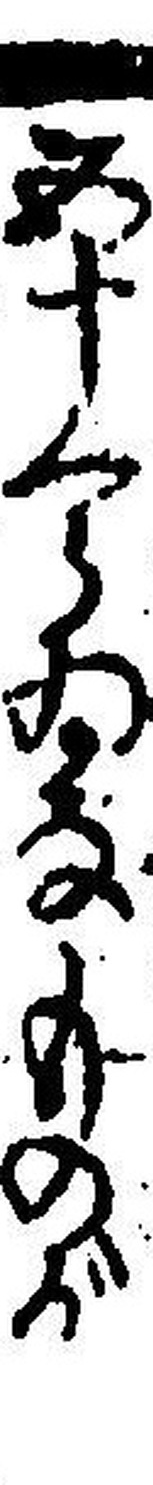五十くらゐなものが
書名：徳若水縁起金性 / 樹下石上作
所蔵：東京大学総合図書館 General Library in the University of Tokyo, JAPAN
